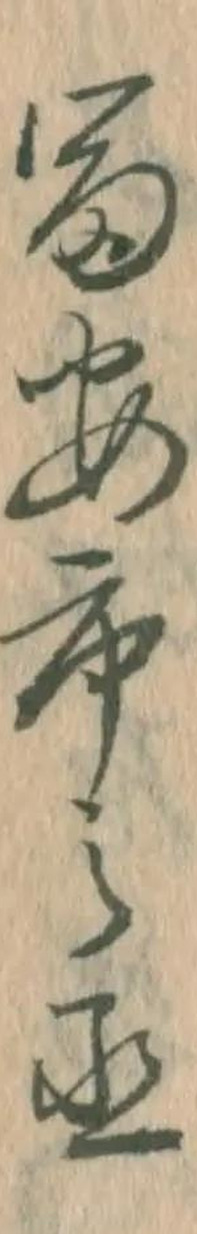冨安市之丞
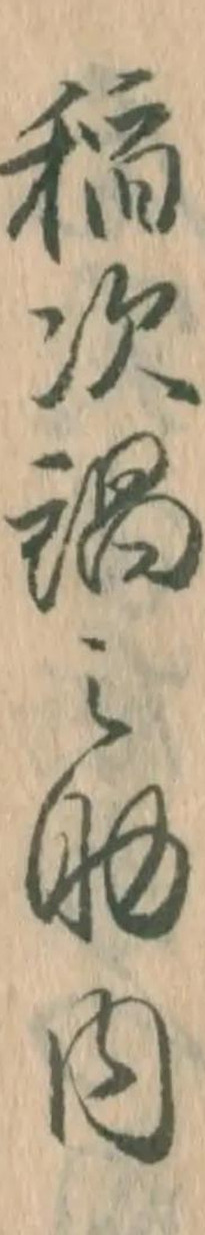稲次鍋之助内
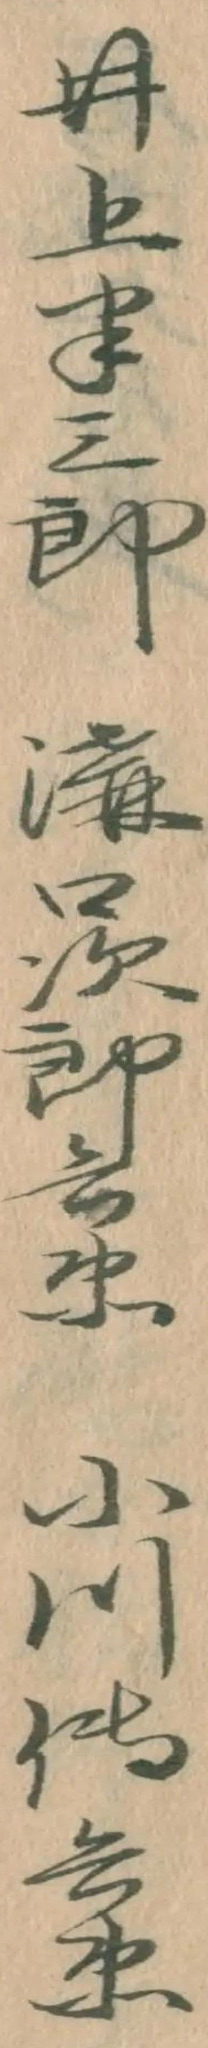井上半三郎溝口次郎兵衛小川伝兵衛

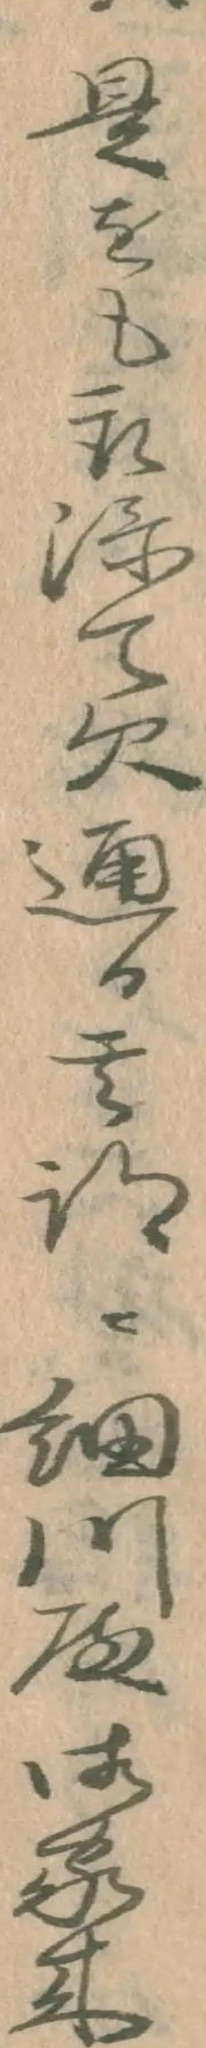は是をも取添て欠通る其跡に細川殿御家来
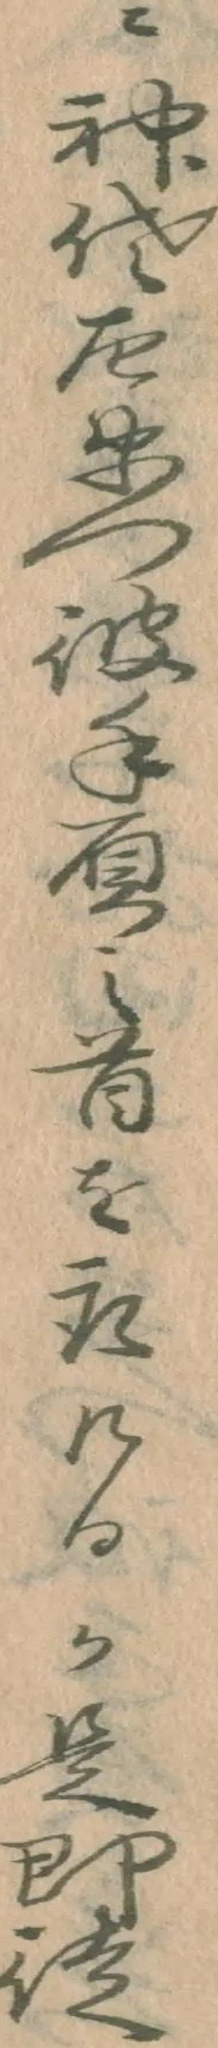に神佐左衛門彼手負之首を取けるか是即徒
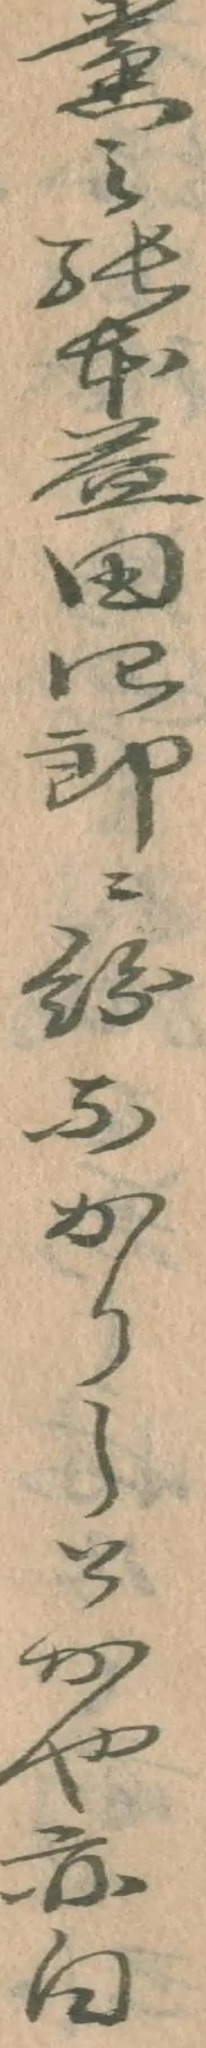党之張本益田四郎に紛なかりしとか也亦白
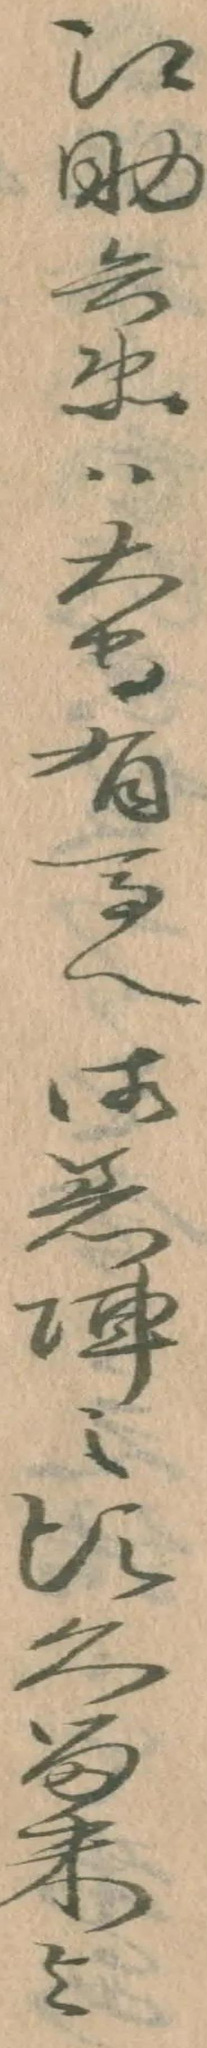江助兵衛は大守有馬へ御着陣之頃久留米与
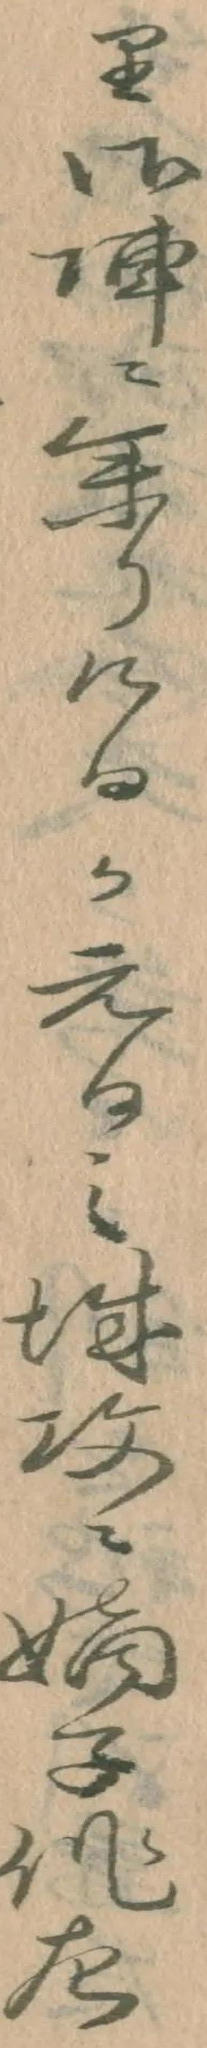里御陣に参りけるか元日之城攻に嫡子作左
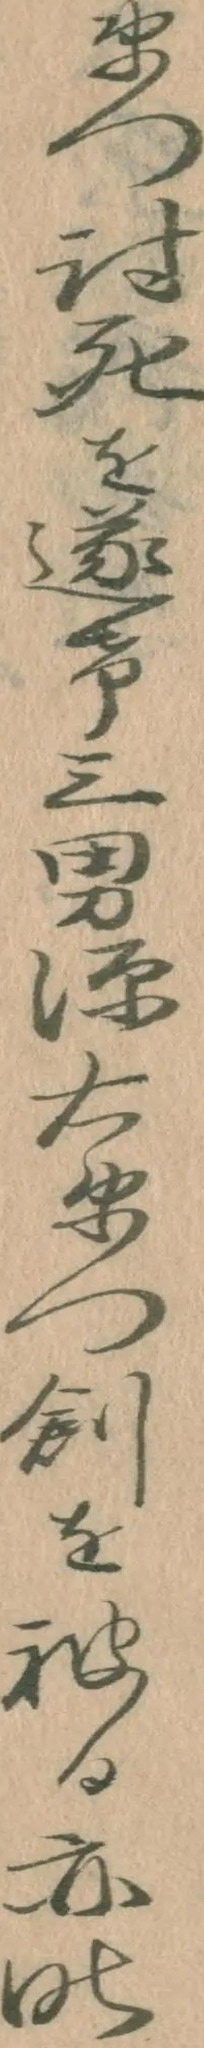衛門討死を遂希三男源右衛門創を被る亦昨
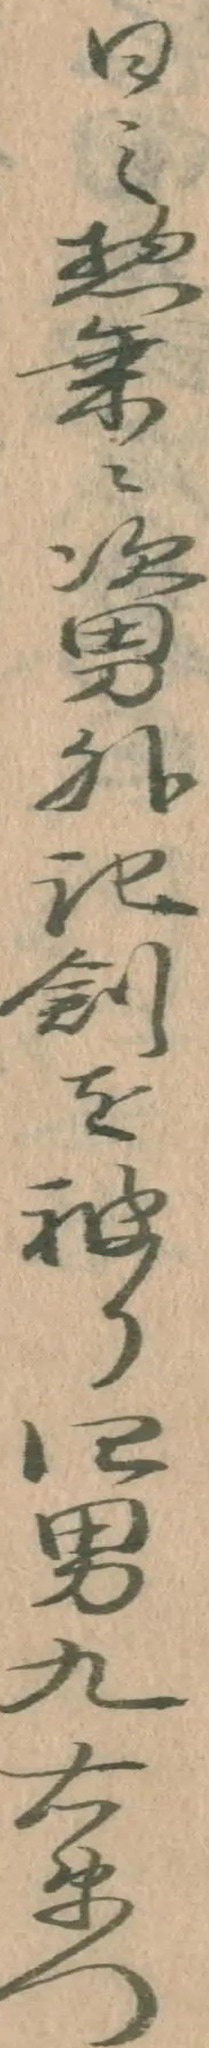日之惣乗に次男外記創を被り四男九右衛門
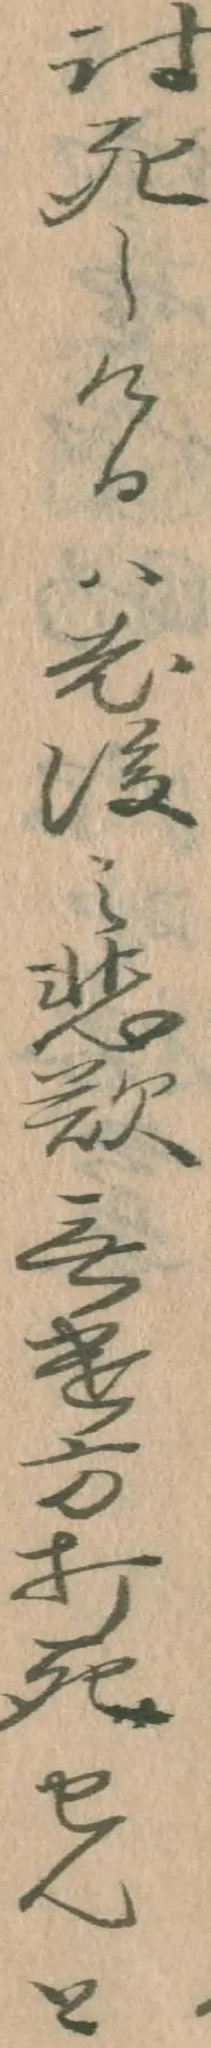討死しけるは老後之悲歎無遣方打死せんと
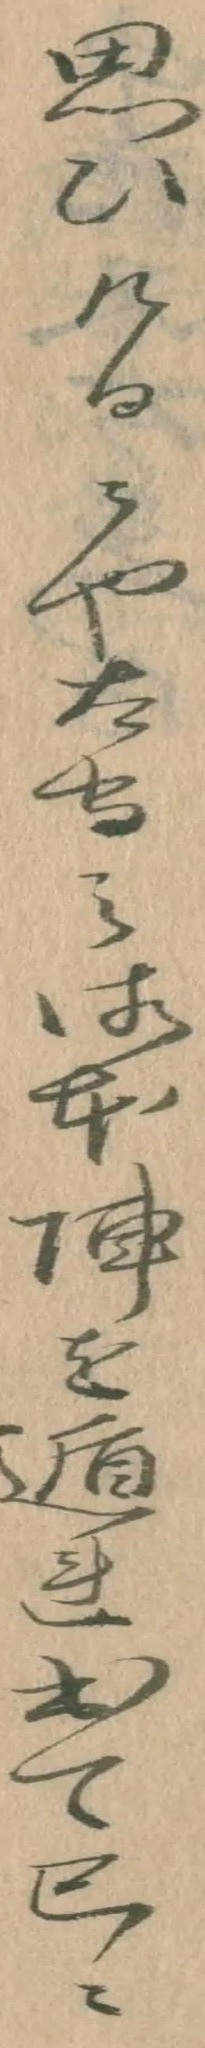思ひけるに也太守之御本陣を遁連出て巳に
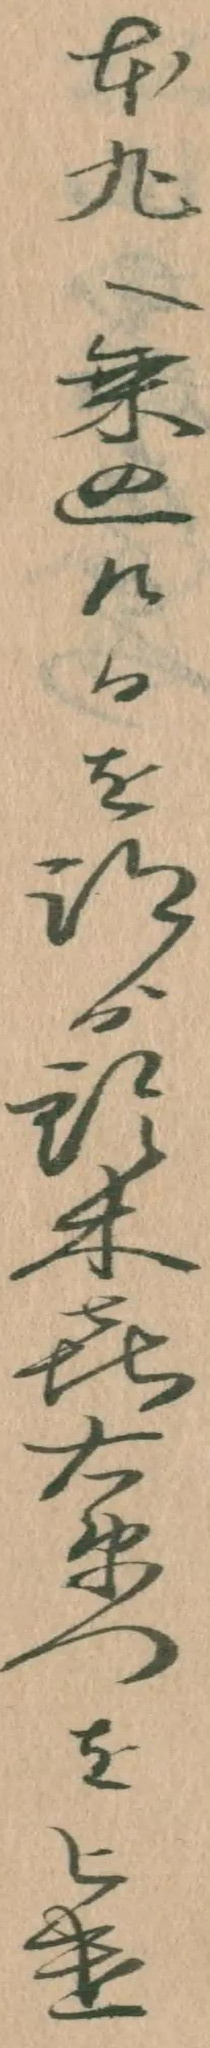本丸へ乗込けるを跡ゟ鈴木喜右衛門を被遣
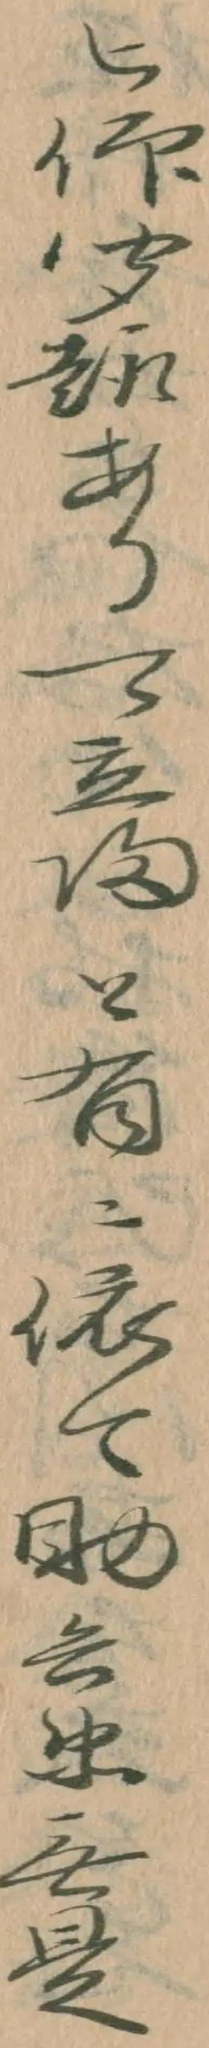被仰聞趣あり可立帰と有に依て助兵衛無是
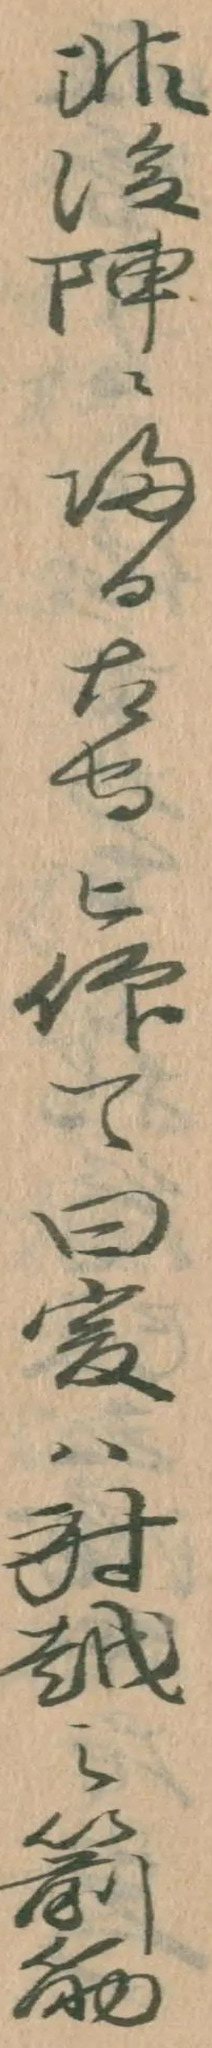非後陣に帰る太守被仰て曰爰は射越之箭筋
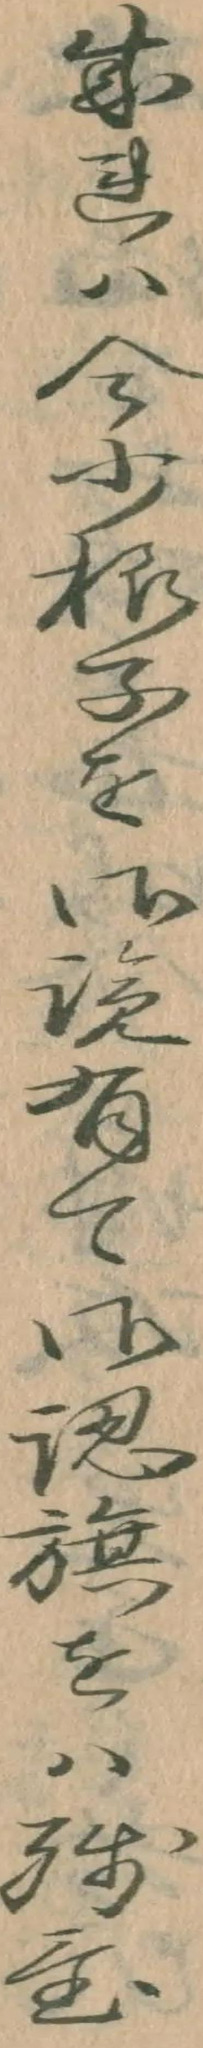成連は今少様子を御覧有て御認旗をは残置
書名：切支丹御退治記 49巻. [9]
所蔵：国立国会図書館 National Diet Library, JAPAN
